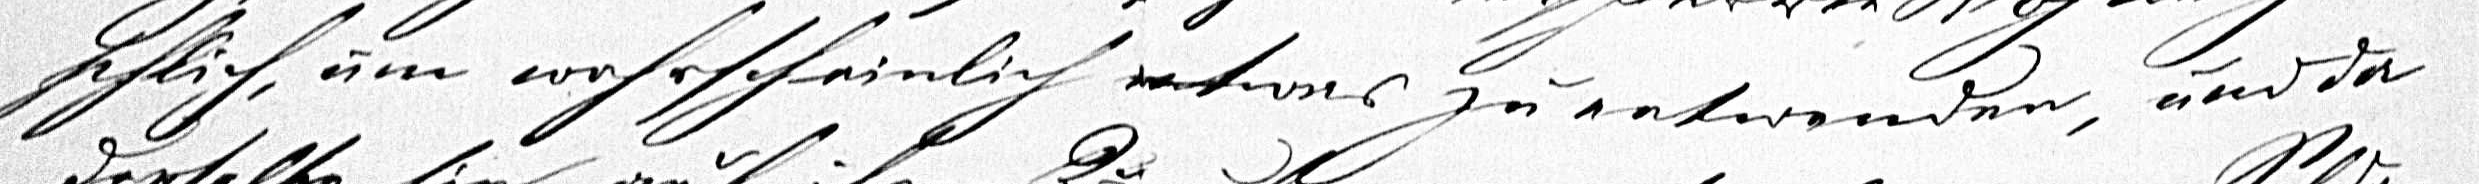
schlich, um wahrscheinlich etwas zu entwenden, und da
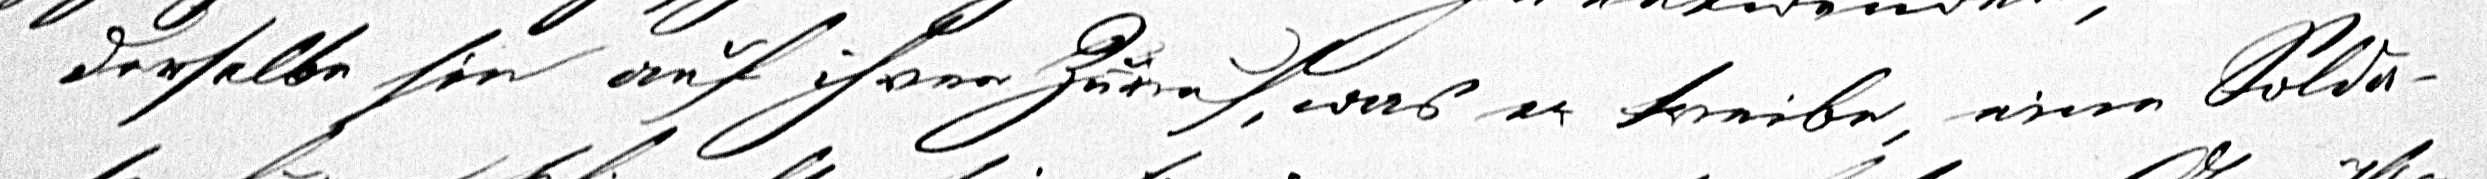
derselbe sie auf irer Zuruf, was er treibe, eine Solda¬
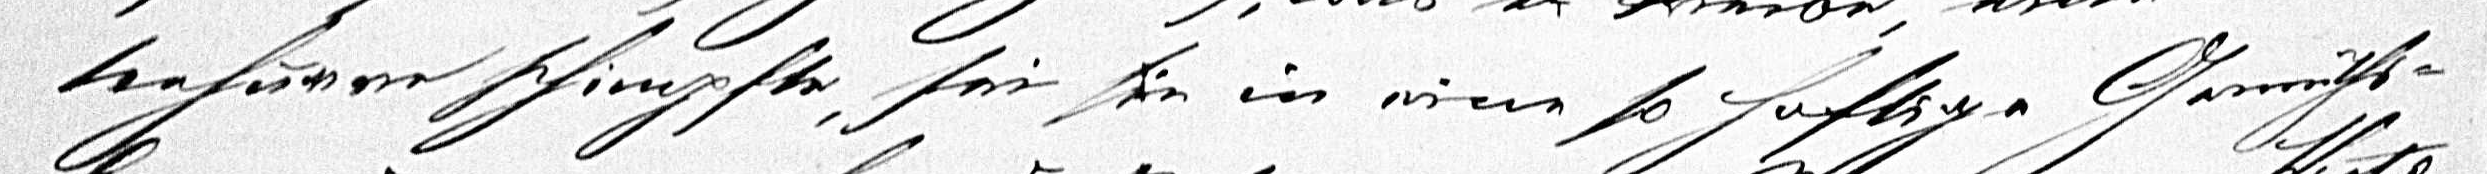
tenhure schimpfte, sei sie in eine so heftige Gemuths¬
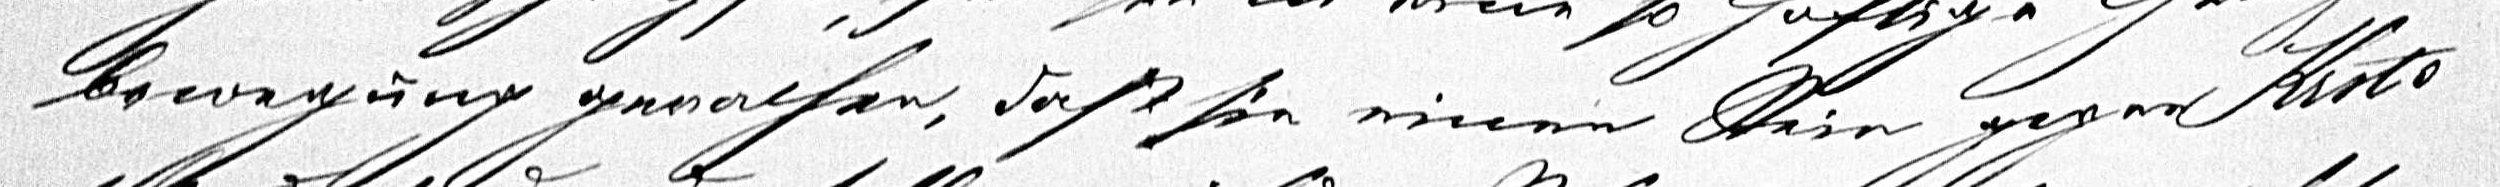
bewegung gerathen, daß sie einen Stein gegen Krsto
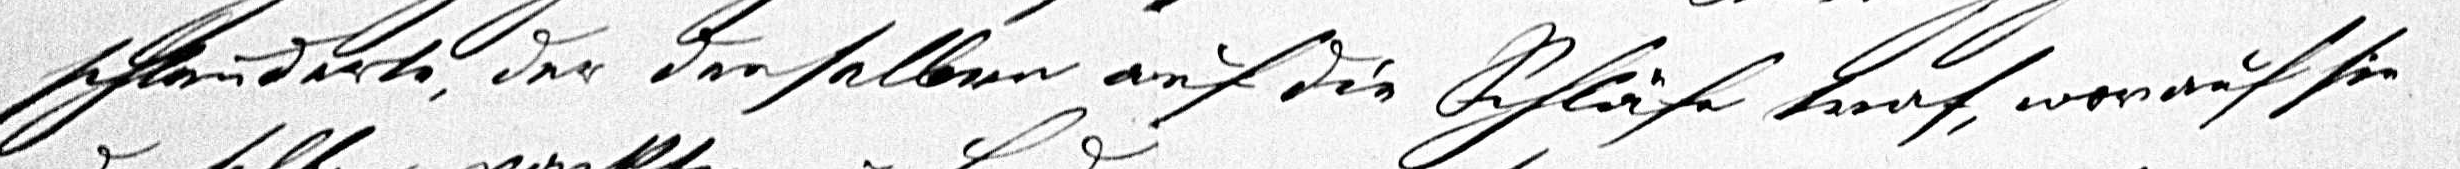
schleuderte, der denselben auf die Schläfe traf, worauf sie
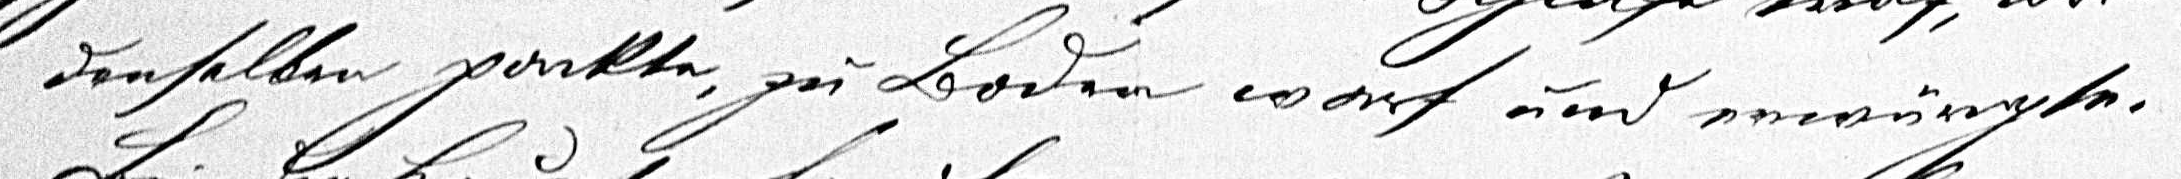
denselben packte, zu Boden worf und erwürgte.
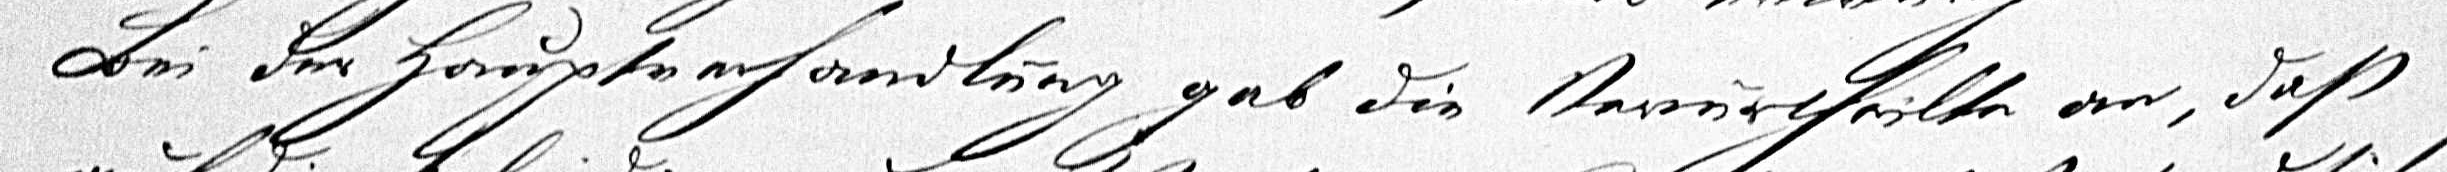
Bei der Hauptverhandlung gab die Verurtheilte an, daß
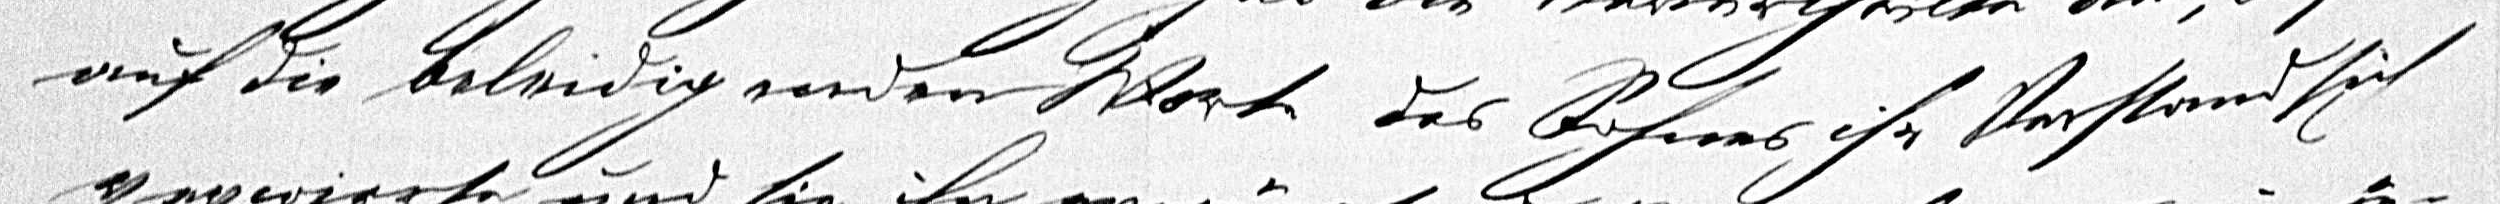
auf die beleidigenden Worte des Sohnes ihr Verstand sich
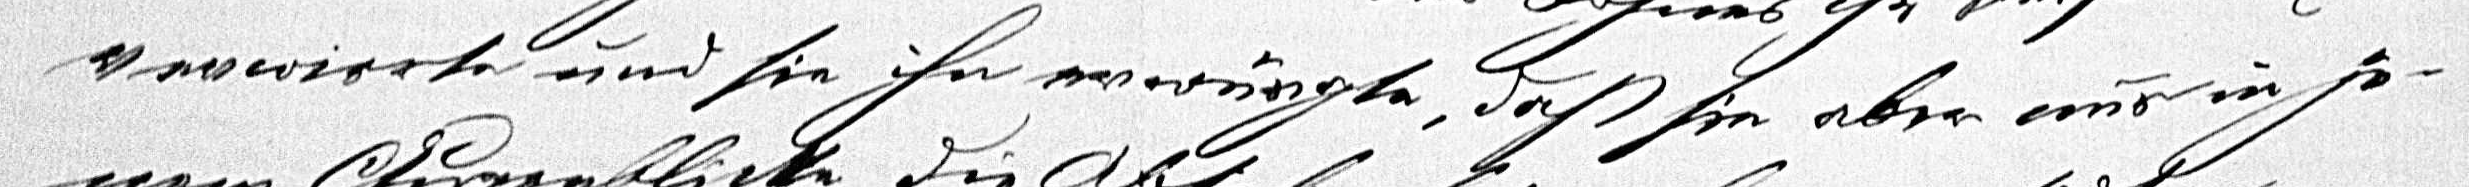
verwirrte und sie ihn erwürgte, daß sie aber nur in je¬
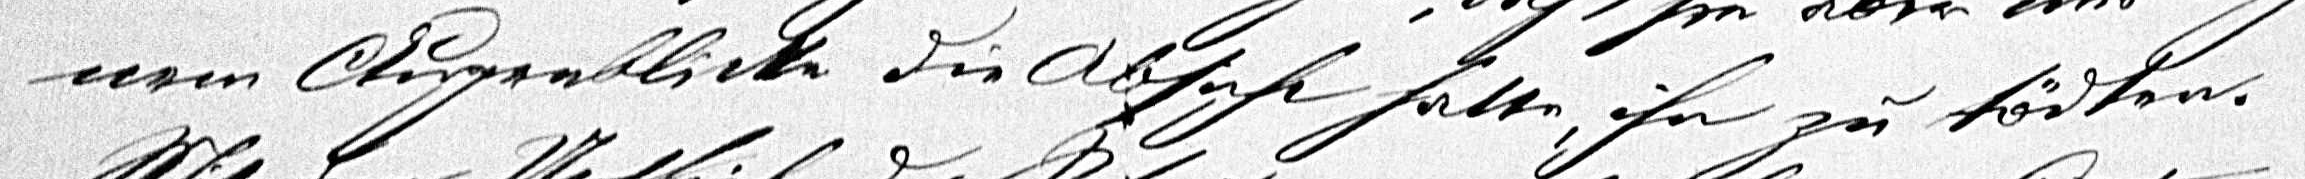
nen Augenblicke die Absicht hatte ihn zu tödten.
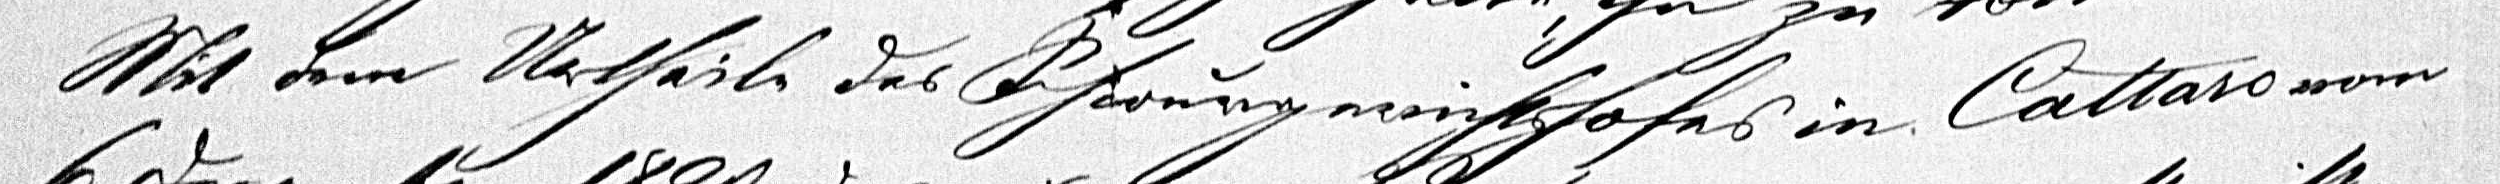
Mit dem Urtheile des Schwurgerichtshofes in Cattaro vom
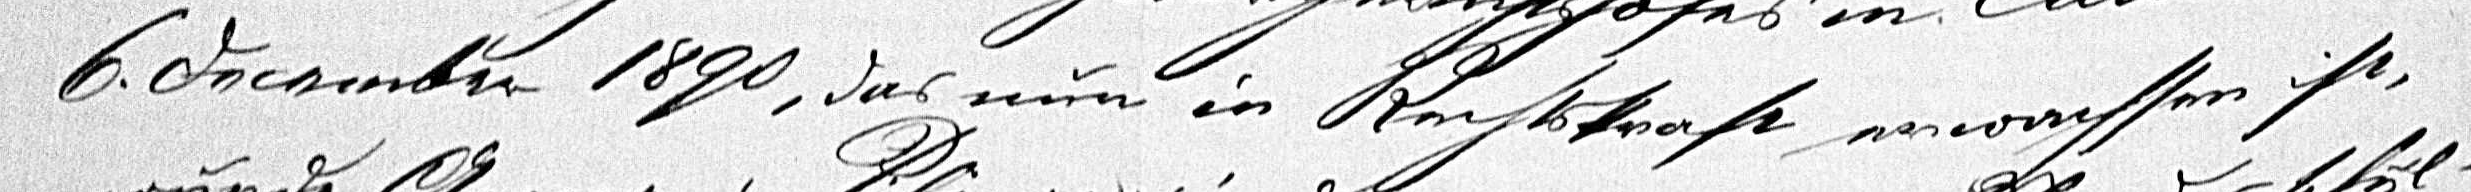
6 December 1890, das un in Rechtskraft anwachsen ist,
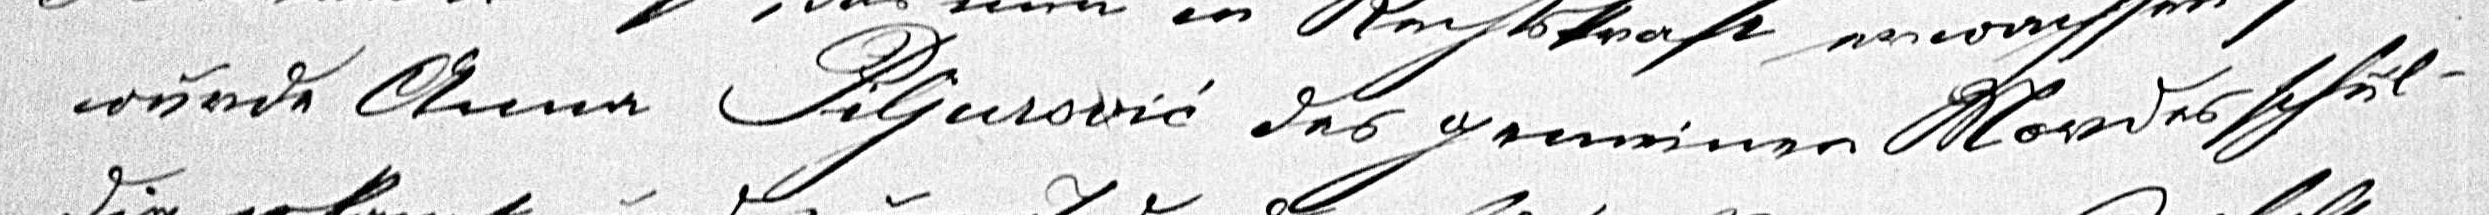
wurde Anna Piljurović des gemeinen Mordes schul¬
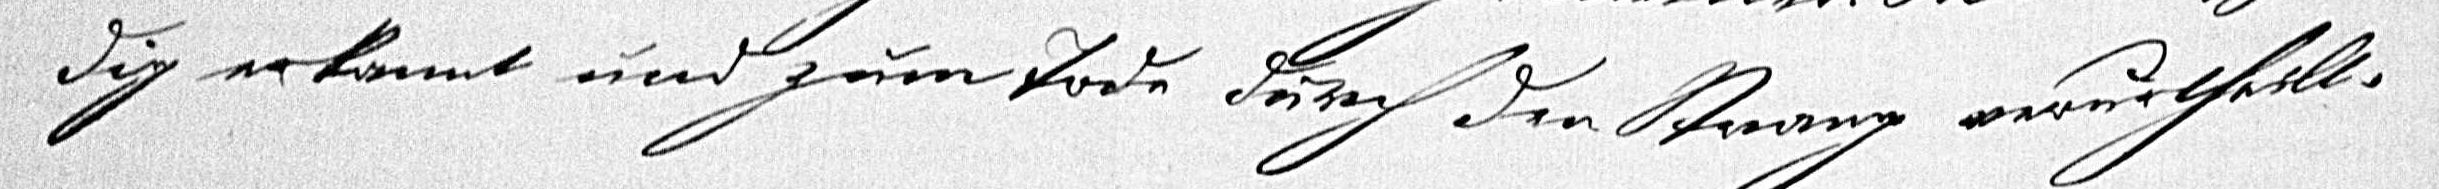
dig erkannt und zum Tode durch den Strang verurtheilt.
